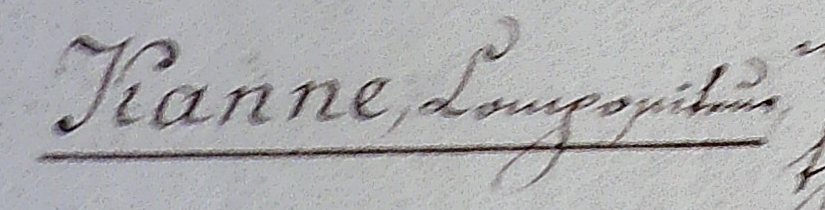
Kanne, Compositeur
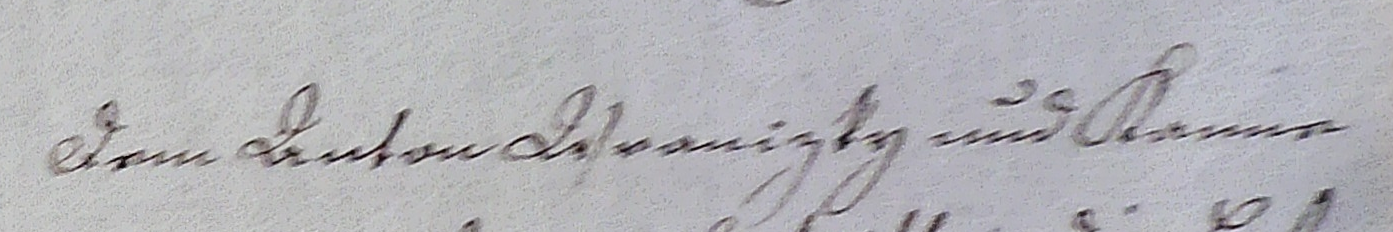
Dem Anton Wranizky und Kanne
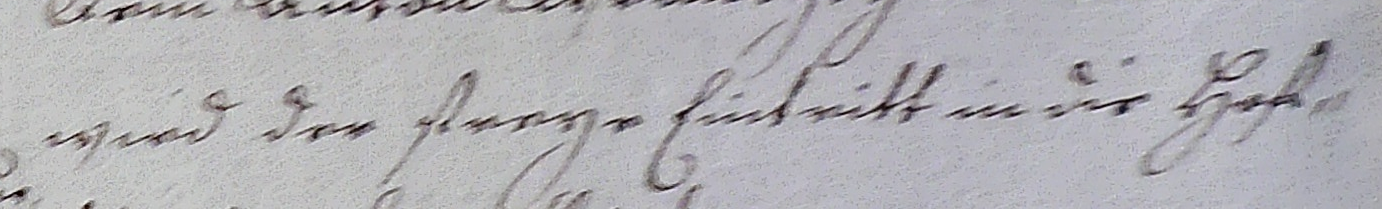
wird der freye Eintritt in die Hof¬
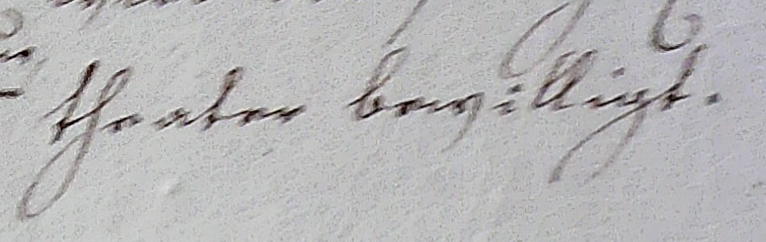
theater bewilligt.
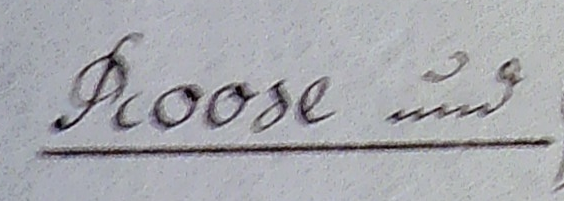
Roose und
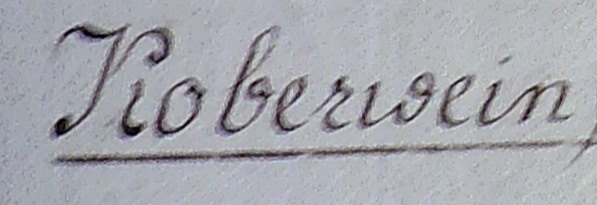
Koberwein
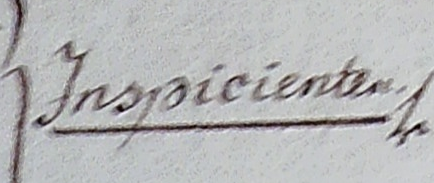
Inspizienten.
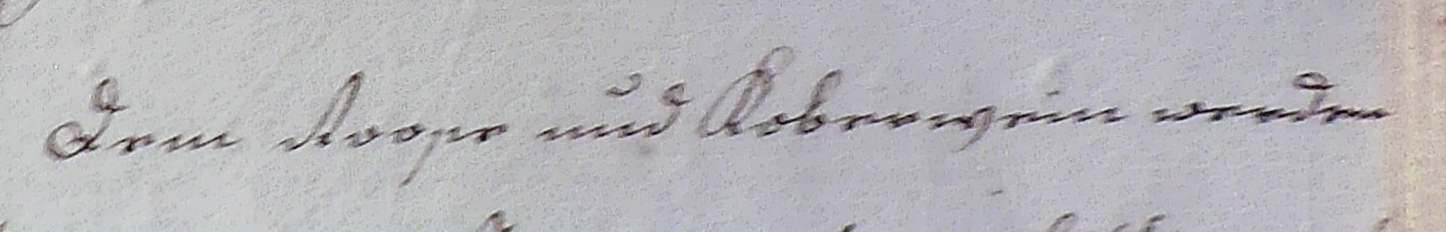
Dem Roose und Koberwein werden
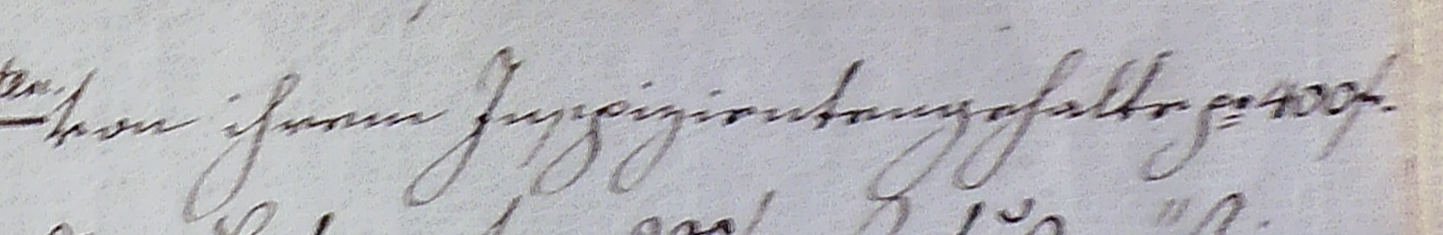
von ihrem Inspizientengehalte pr͇ 400fr.
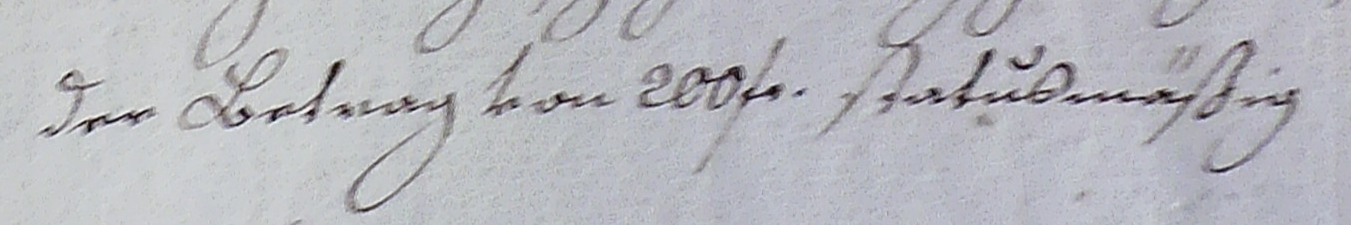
der Betrag von 200fr. statusmäßig
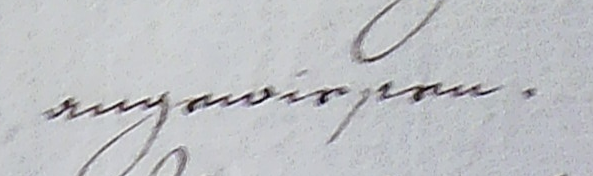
angewiesen.
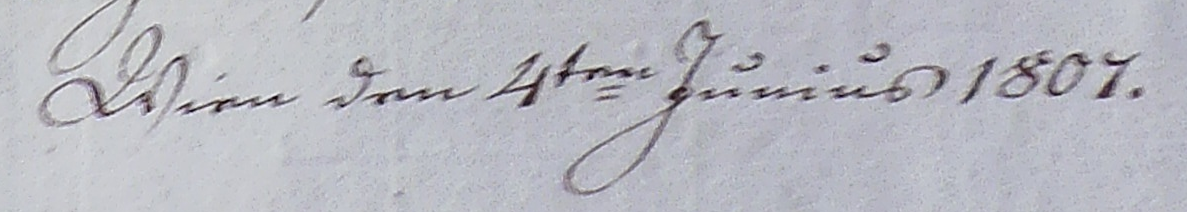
Wien den 4te͇n Junius 1807.
